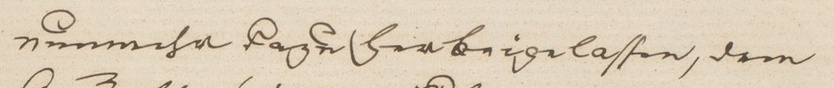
nunmehr dazu herbeigelassen, dem
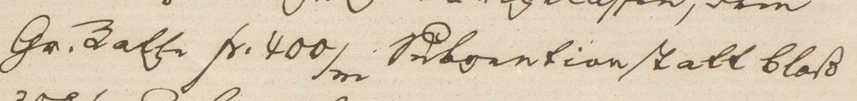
Gr. Rathe fr. 400/m Subvention statt bloß
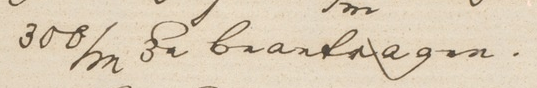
300/m zu beantragen.
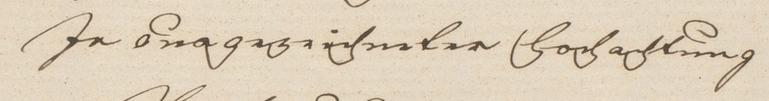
In ausgezeichneter Hochachtung
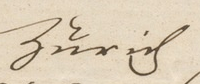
Zürich
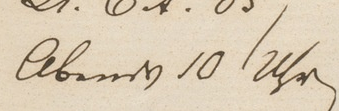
Abends 10 Uhr
